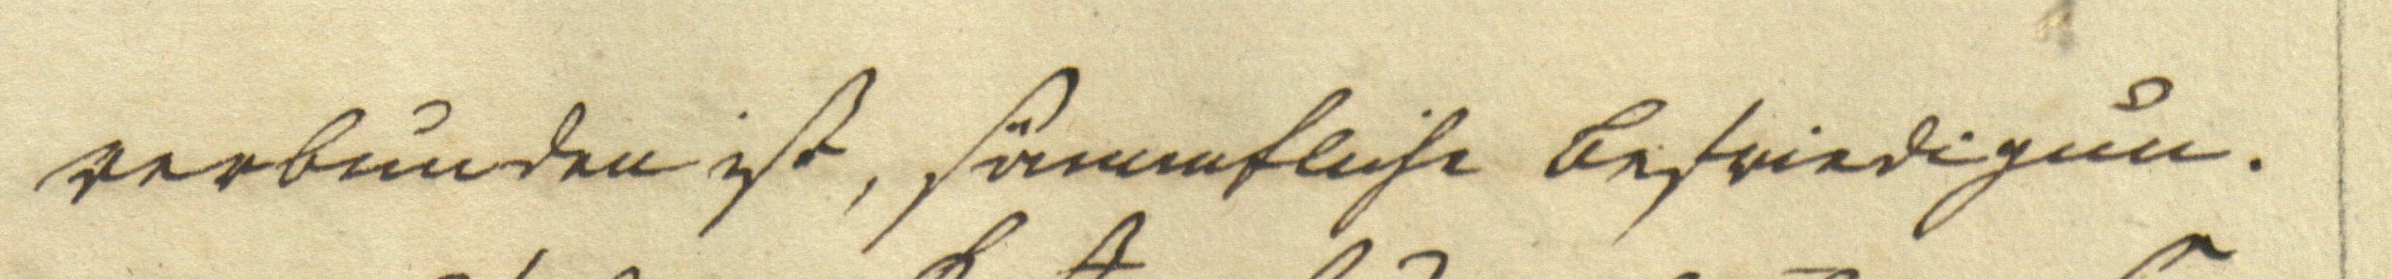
verbunden ist, sämmtliche Befriedigun¬
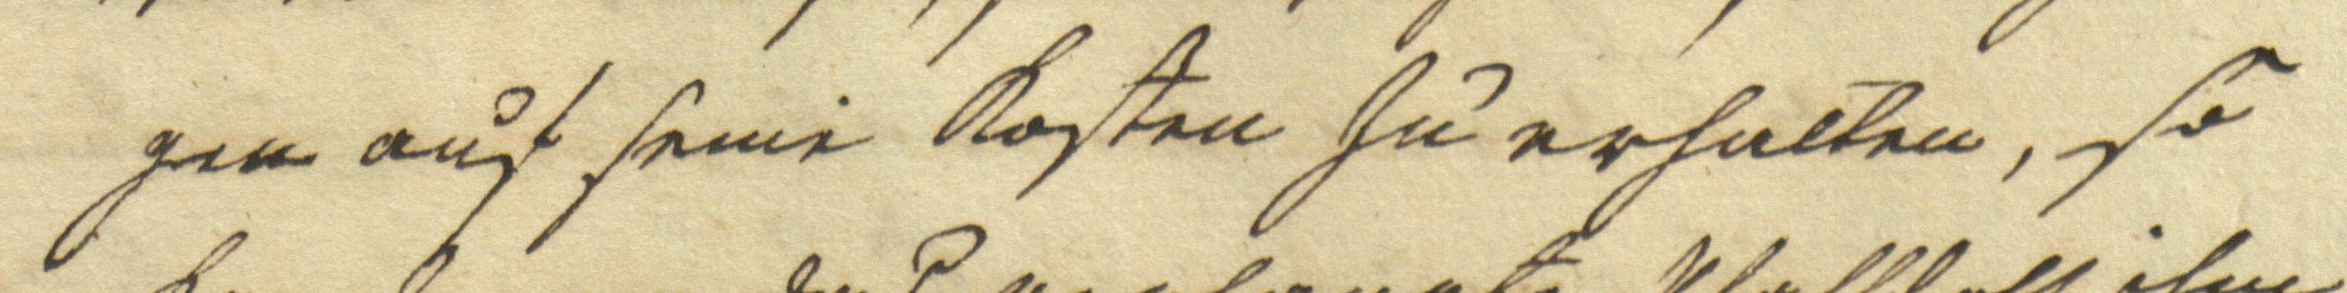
gen auf seine Kosten zu erhalten, so
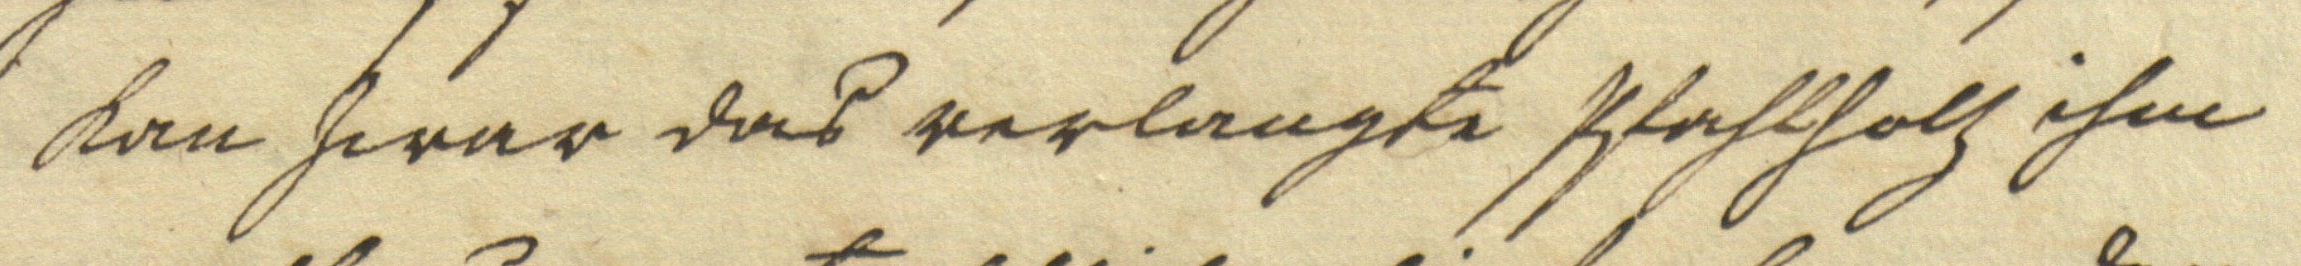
kan zwar das verlangte Pfahlholz ihm
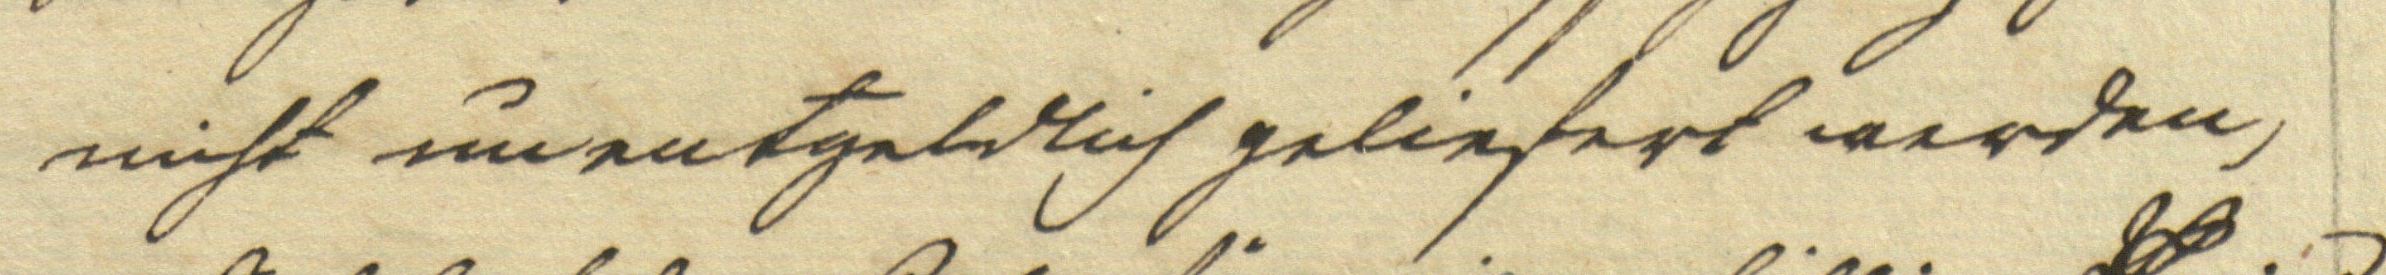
nicht unentgeldlich geliefert werden,
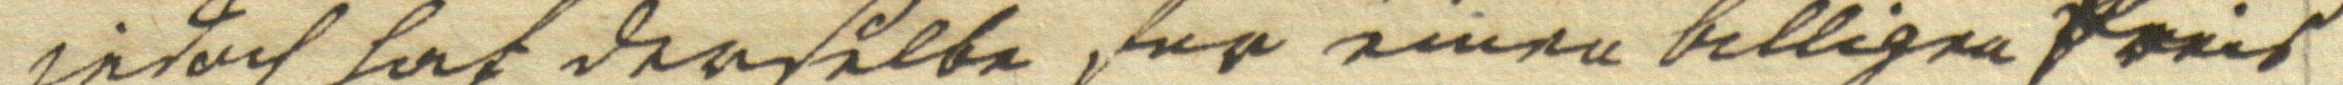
jedoch hat derselbe für einen billigen Preis
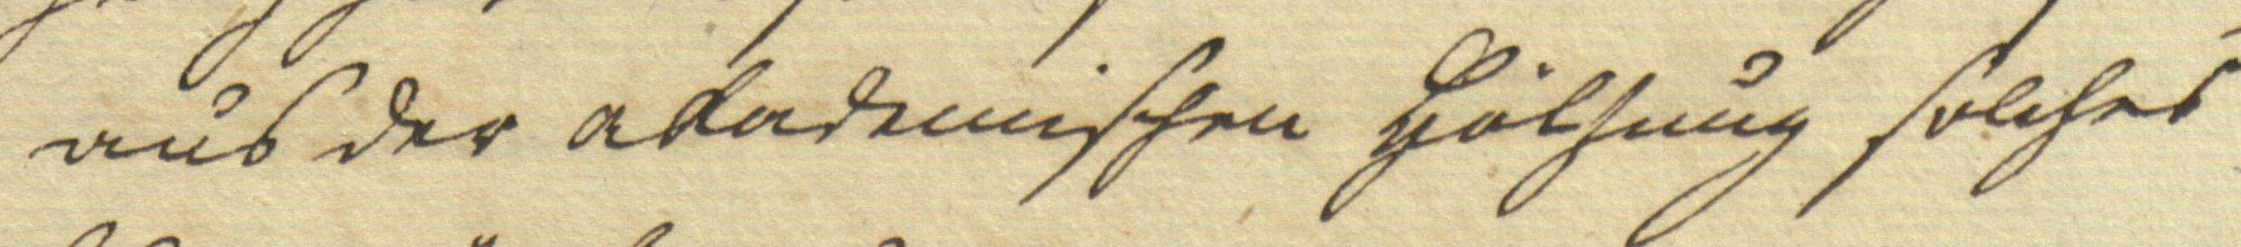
aus der akademischen Hölzung solches
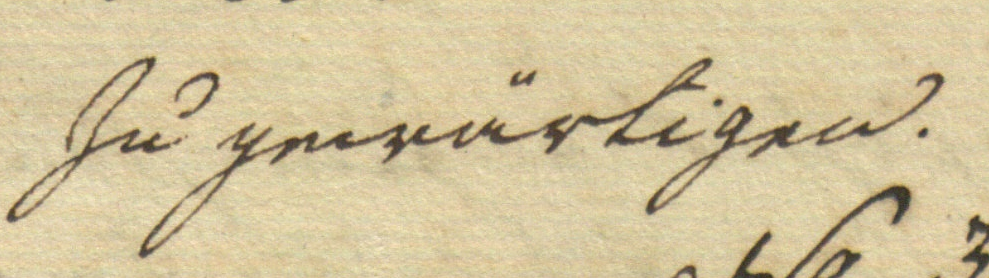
zu gewärtigen.
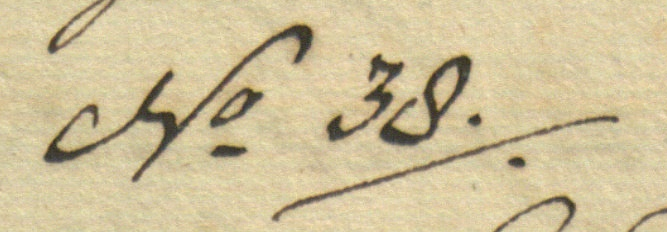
No 38.
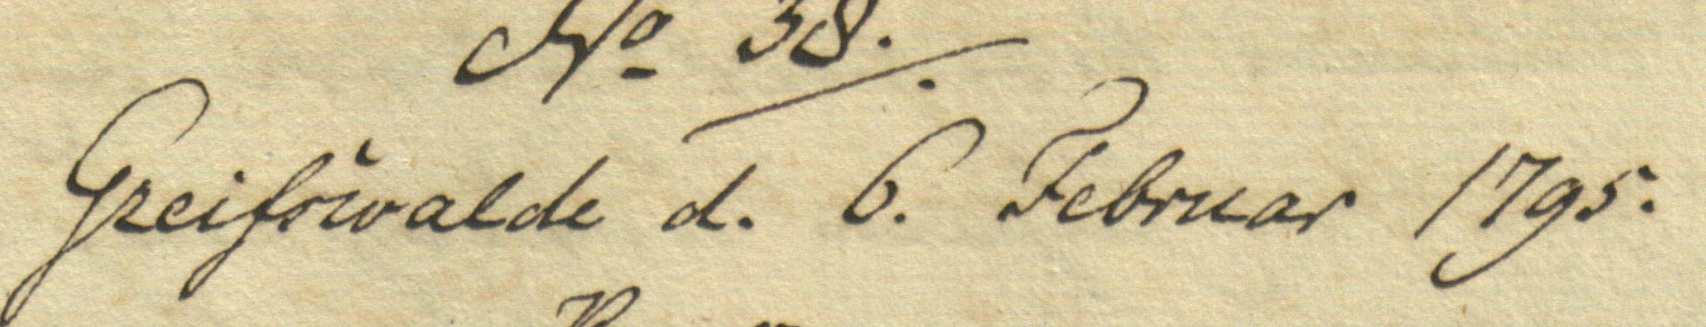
Greifswalde d. 6. Februar 1795.
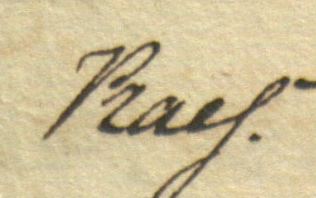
Praes.
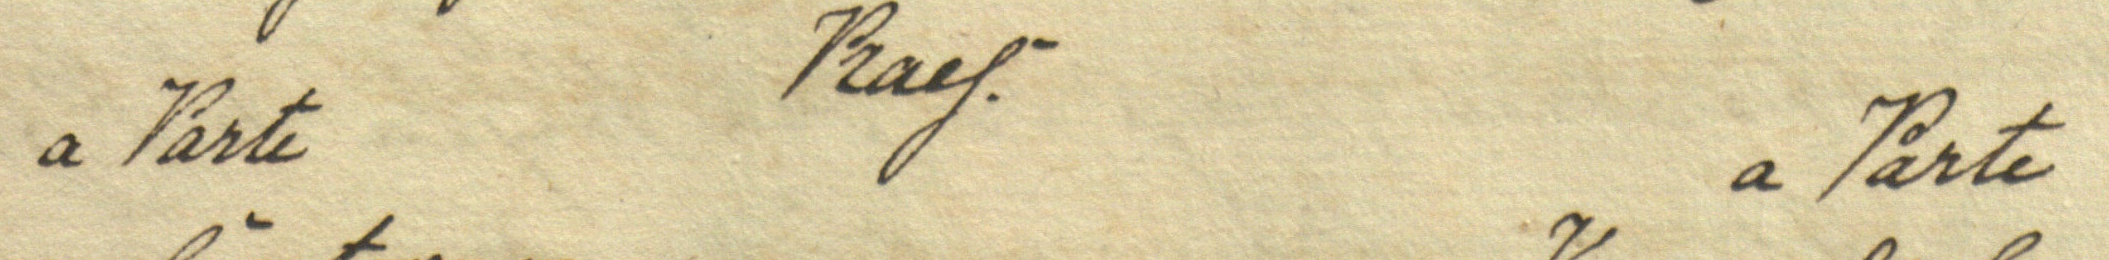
a Parte a Parte
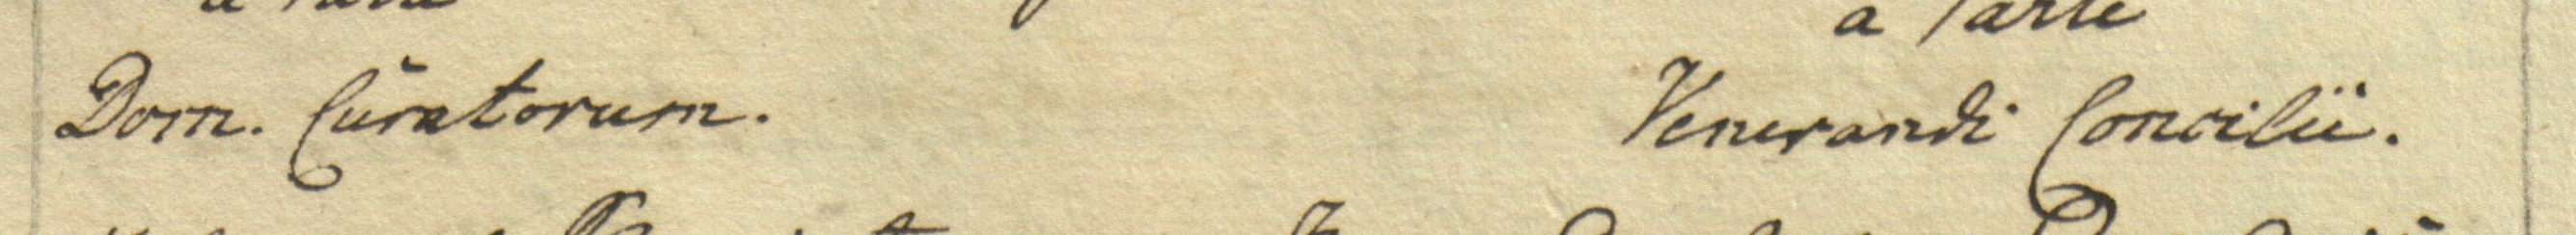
Dom. Curatorum. Venerandi Concilii.
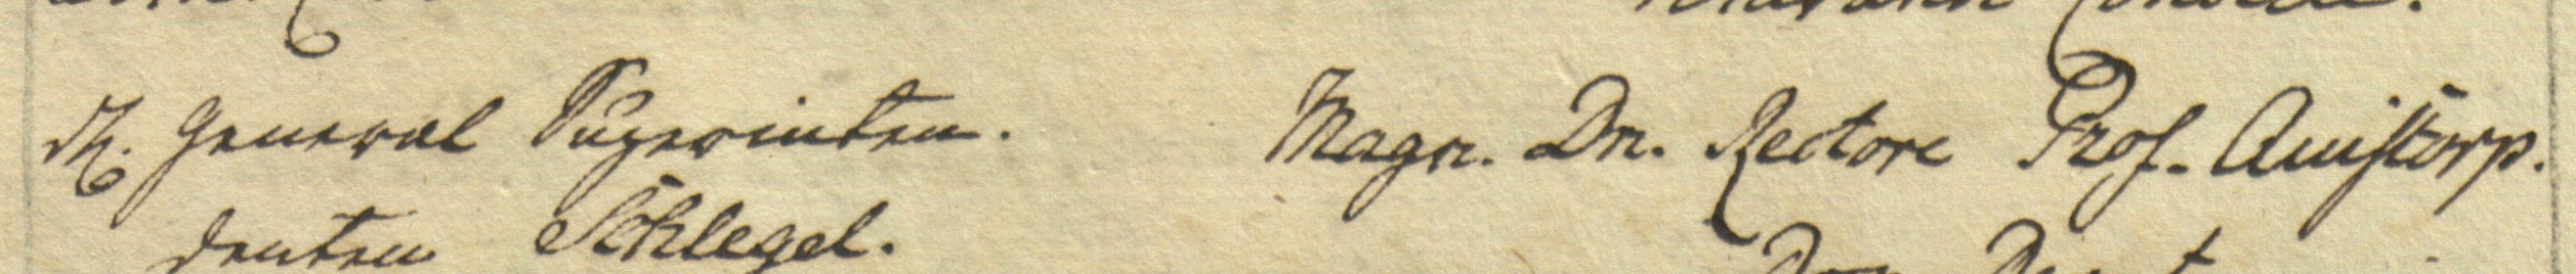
dh. General Superinten¬ Magn. Dn. Rectore Prof. Quistorp.
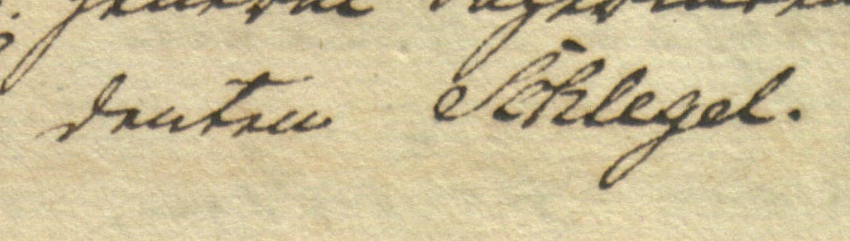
denten Schlegel.
